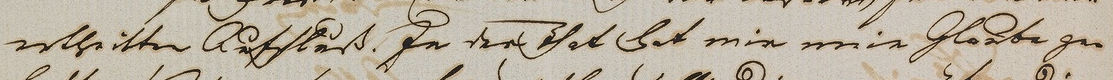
ertheilten Aufchluß. In der That hat mir mein Glaube ge-
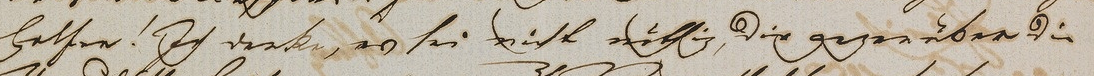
holfen! Ich denke, es sei nicht nöthig, dir gegenüber die
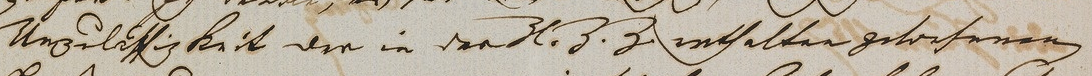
Unzulässigkeit der in der N.Z.Z. enthalten gewesenen
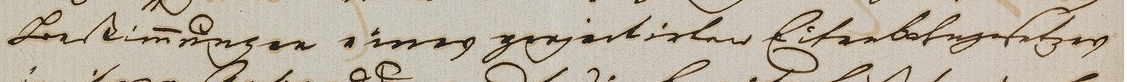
Bestimmungen eines projectirten Eisenbahngesetzes
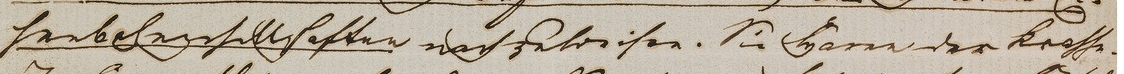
senbahngesellschaften nachzuweisen. Sie wären der krasse-
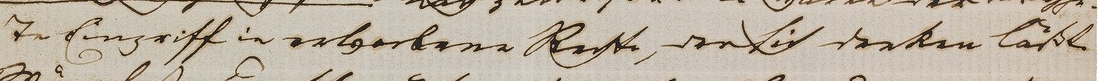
ste Eingriff in erworbene Rechte, der sich denken läßt.
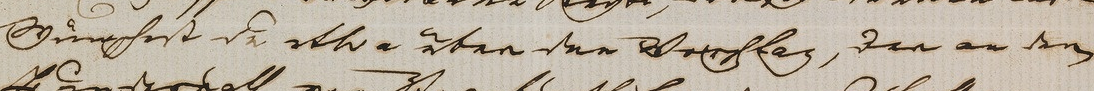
Wünschest Du etwa über den Vorschlag, der an den
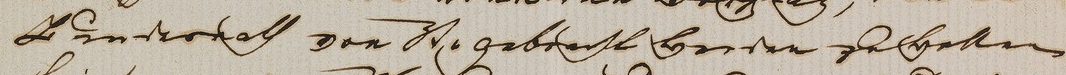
Bundesrath von St. gebracht werden zu wollen
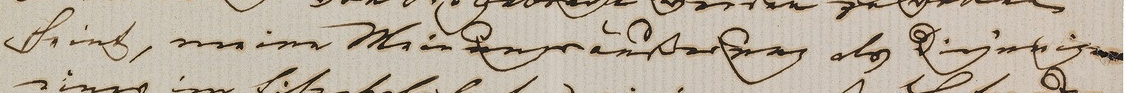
scheint, meine Meinungsäußerung als diejenige
